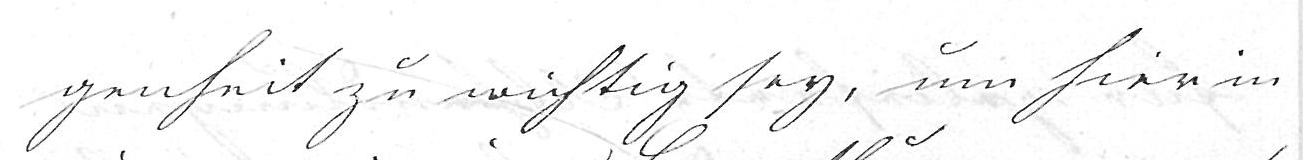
genheit zu wichtig sey, um hier in
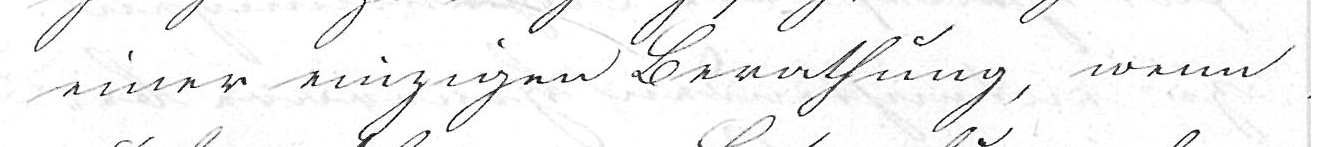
einer einzigen Berathung, wenn
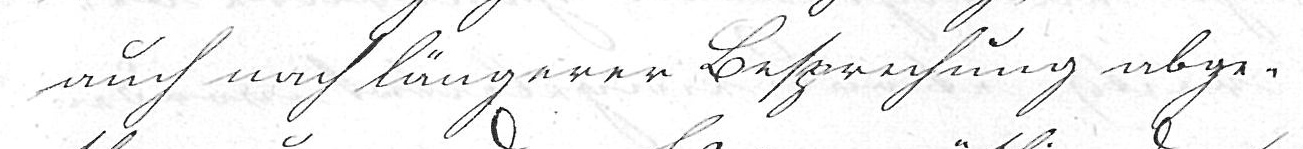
auch nach längerer Besprechung abge-
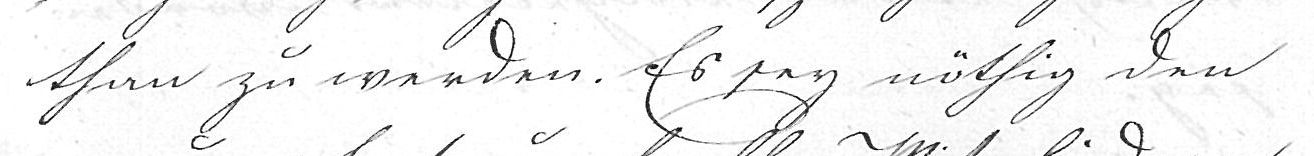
than zu werden. Es sey nöthig den
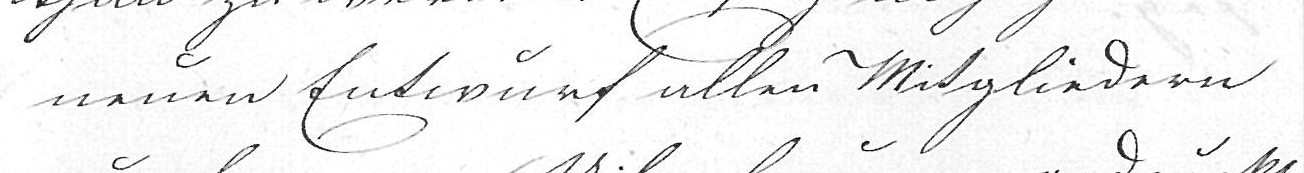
neuen Entwurf allen Mitgliedern
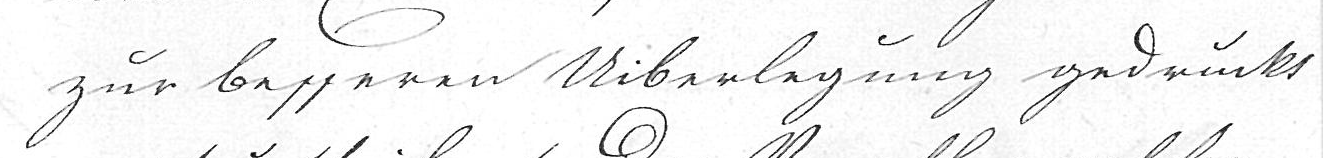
zur besseren Uiberlegung gedruckt
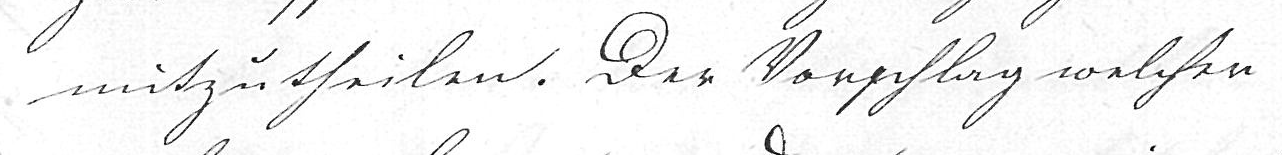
mitzutheilen. Der Vorschlag welcher
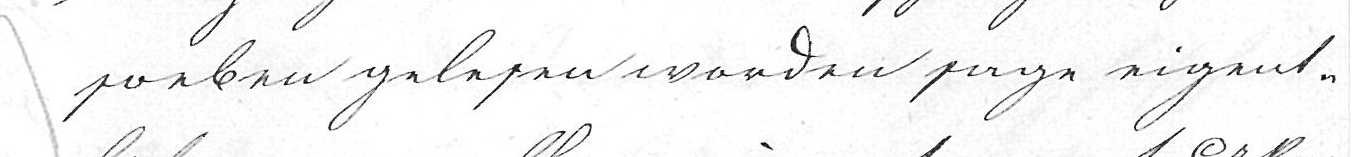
soeben gelesen worden sage eigent-
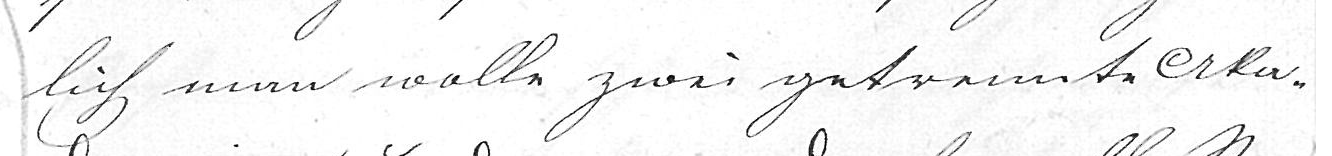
lich man wolle zwei getrennte Aka-
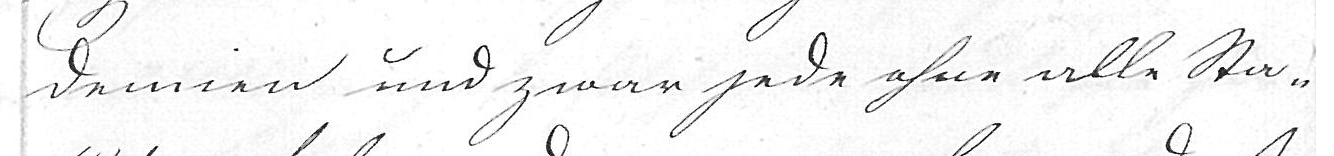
demien und zwar jede ohne alle Sta-
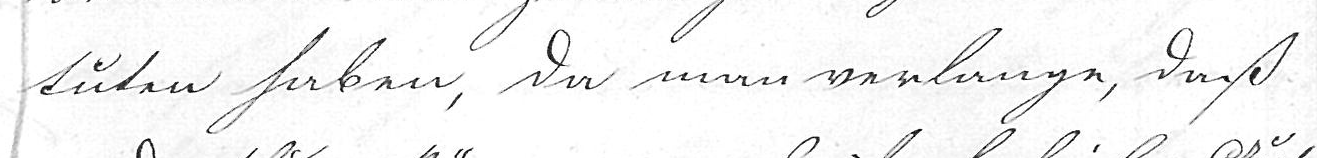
tuten haben, da man verlange, daß
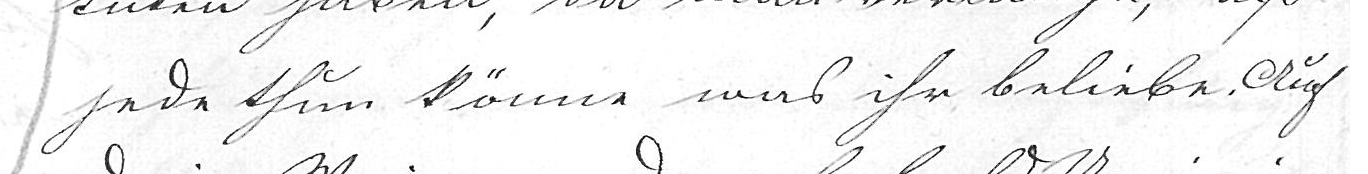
jede thun könne was ihr beliebe. Auf
